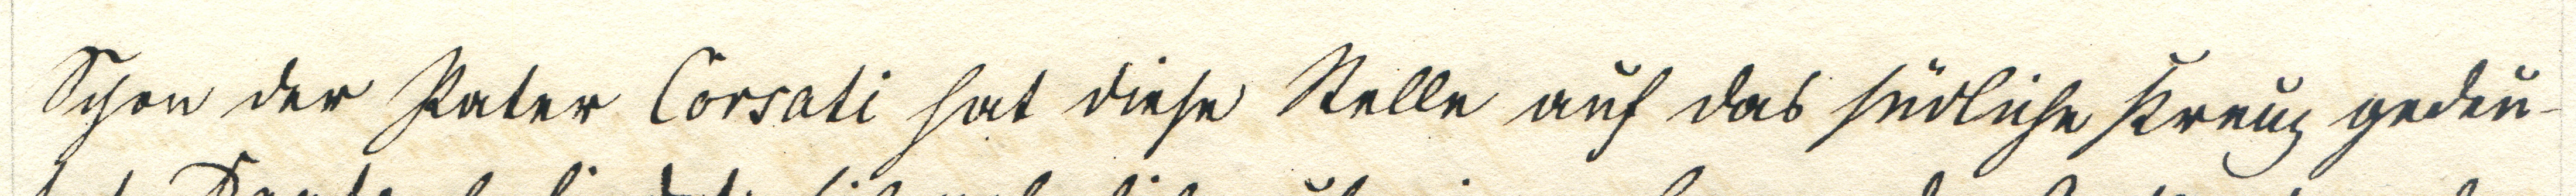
Schon der Pater Corsali hat diese Stelle auf das südliche Kreuz gedeu-
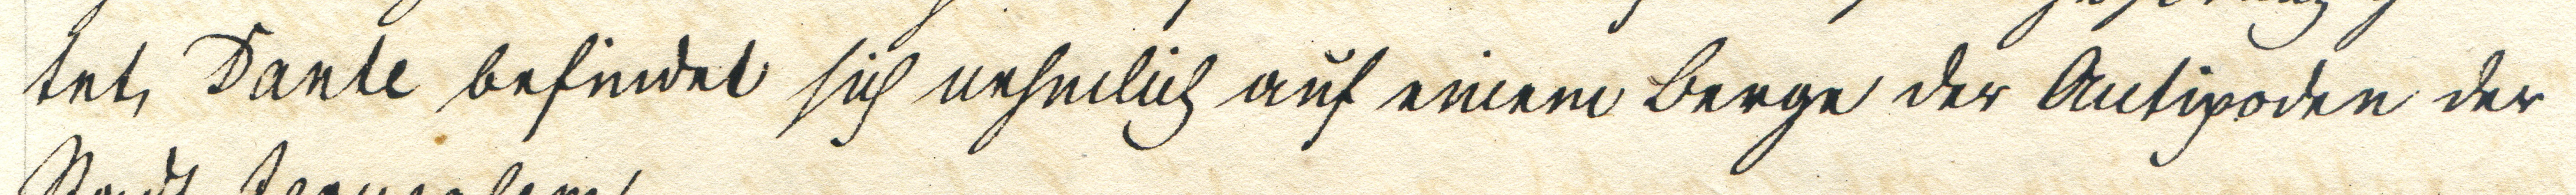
tet. Dante befindet sich nehmlich auf einem Berge der Antipoden der
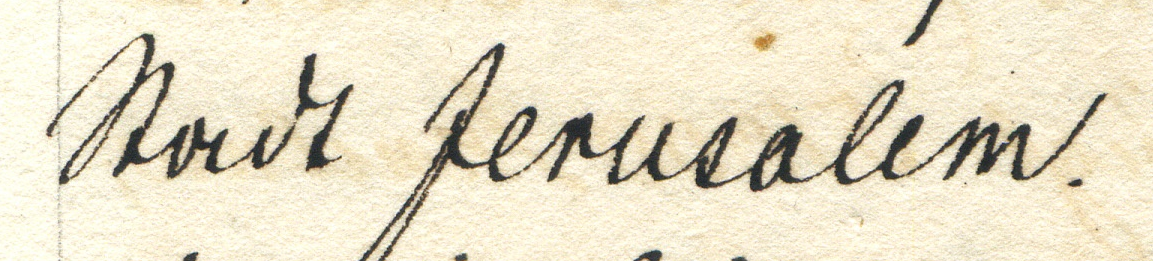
Stadt Jerusalem.
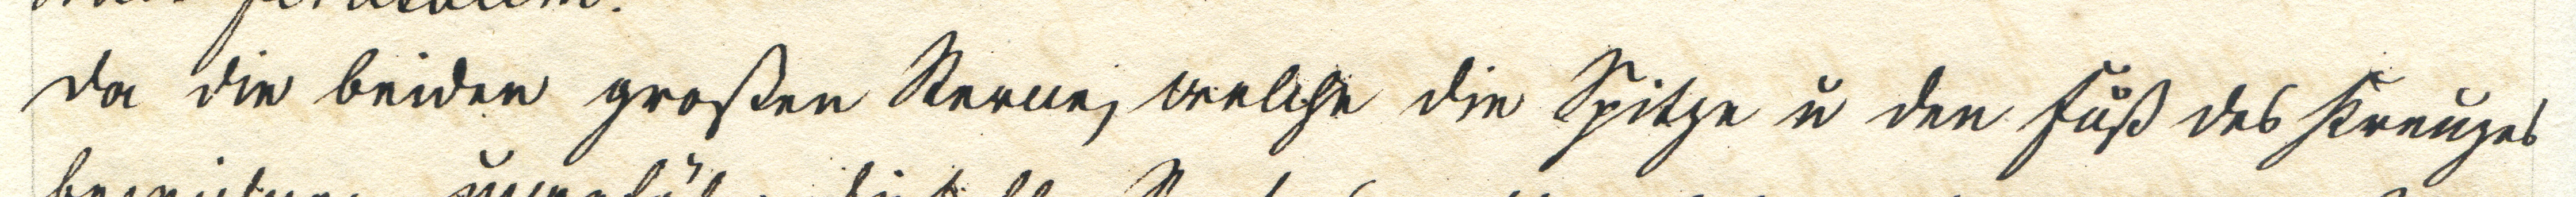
Da die beiden großen Sterne, welche die Spitze u den Fuß des Kreuzes
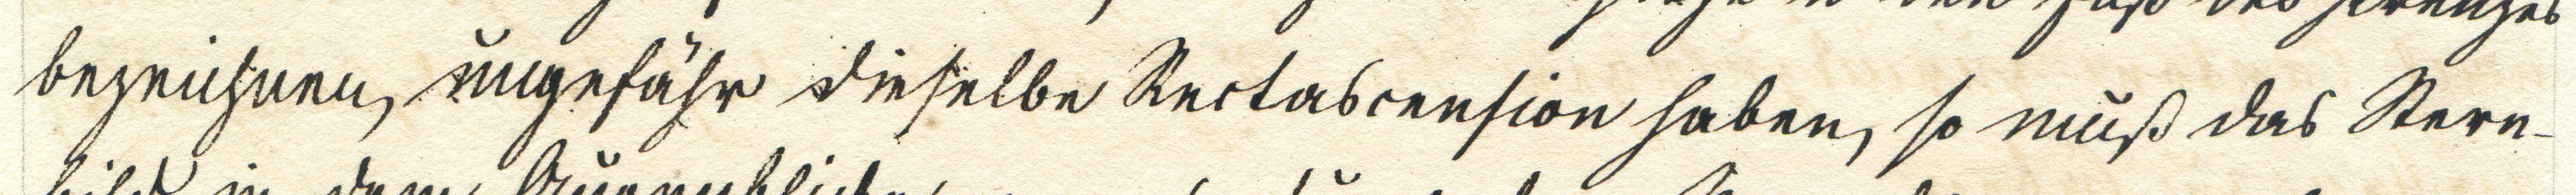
bezeichnen, ungefähr dieselbe Rectascension haben, so muß das Stern-
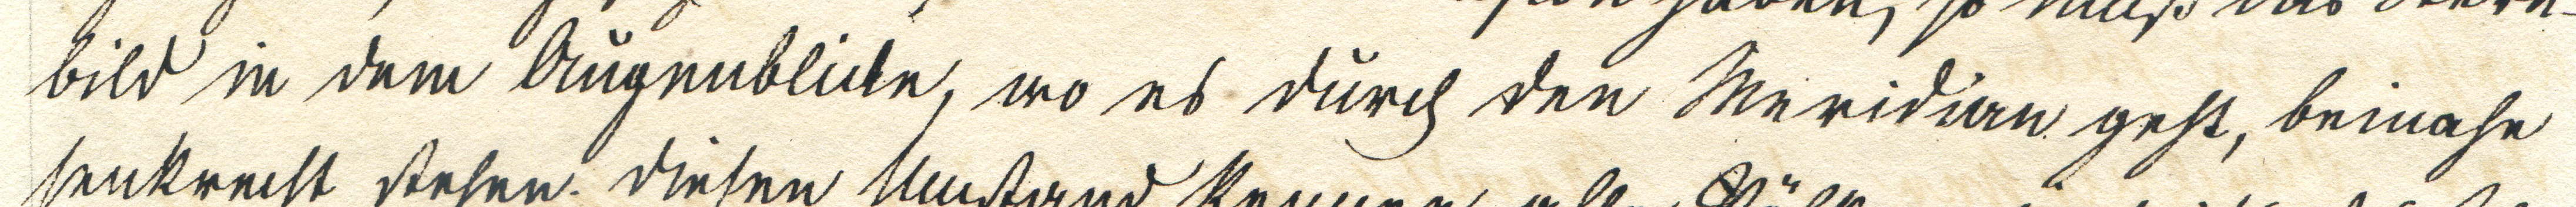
bild in dem Augenblicke, wo es durch den Meridian geht, beinahe
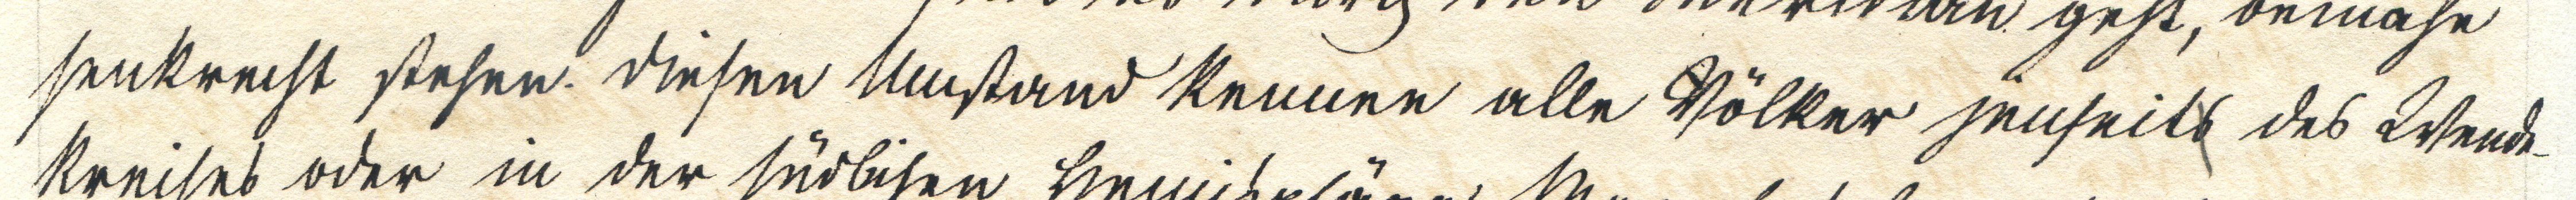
senkrecht stehen. Diesen Umstand kennen alle Völker jenseits des Wende-
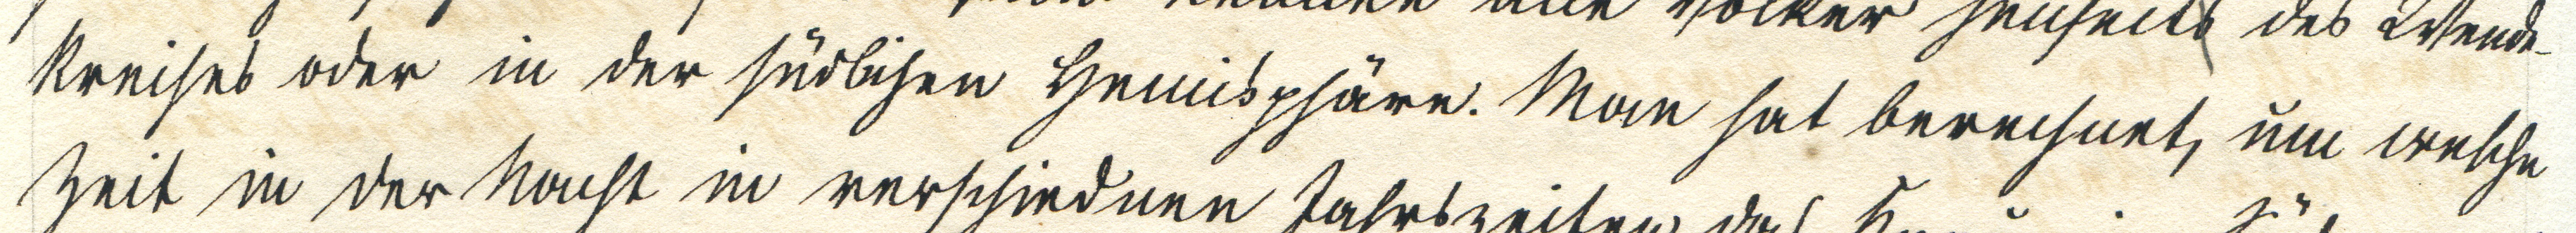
kreises oder in der südlichen Hemisphäre. Man hat berechnet, um welche
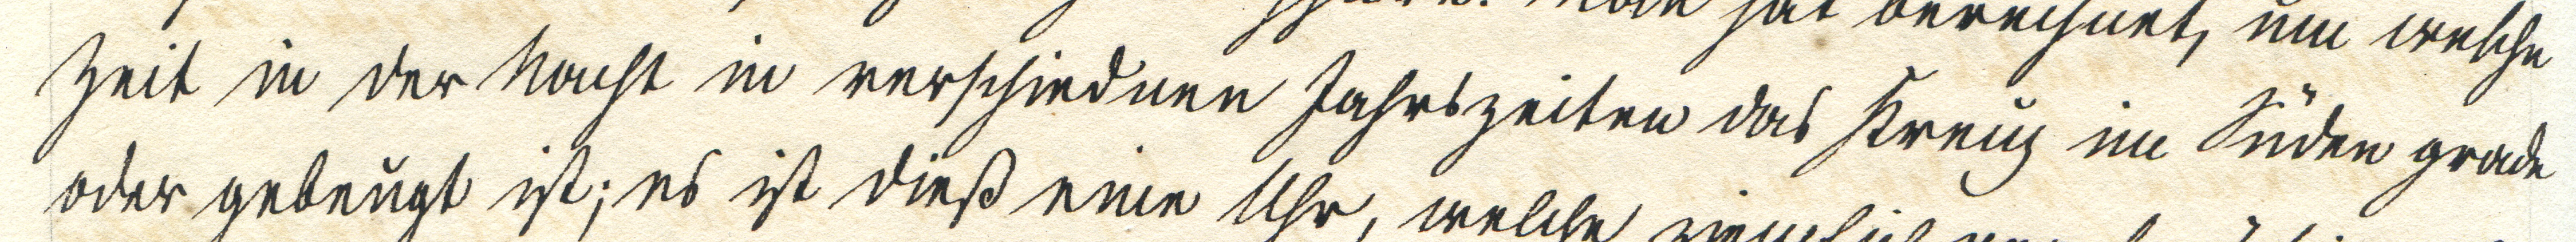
Zeit in der Nacht in verschiednen Jahreszeiten das Kreuz im Süden grade
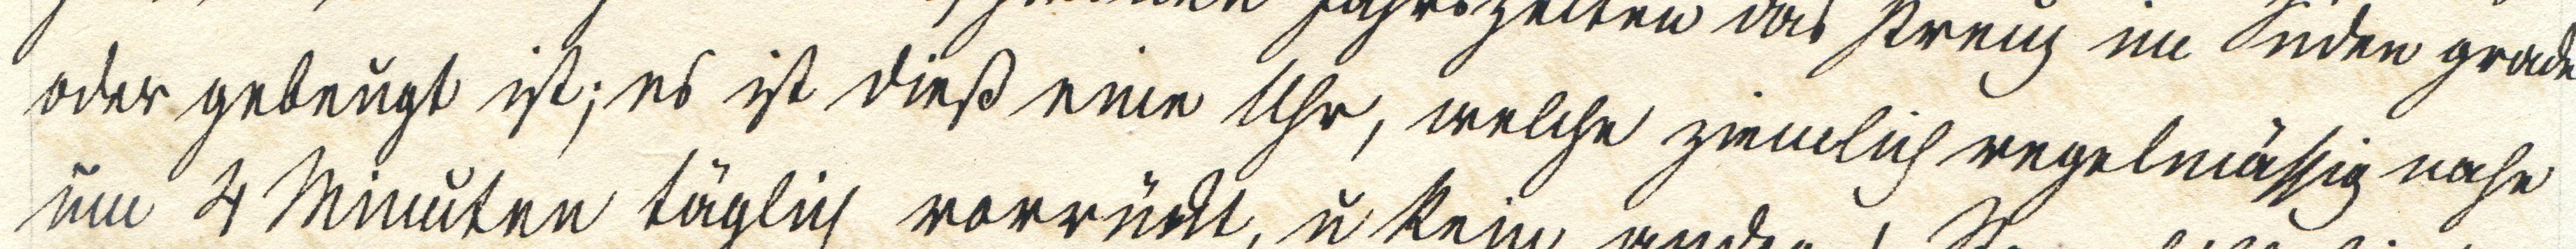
oder gebeugt ist; es ist dieß eine Uhr, welche ziemlich regelmässig nahe
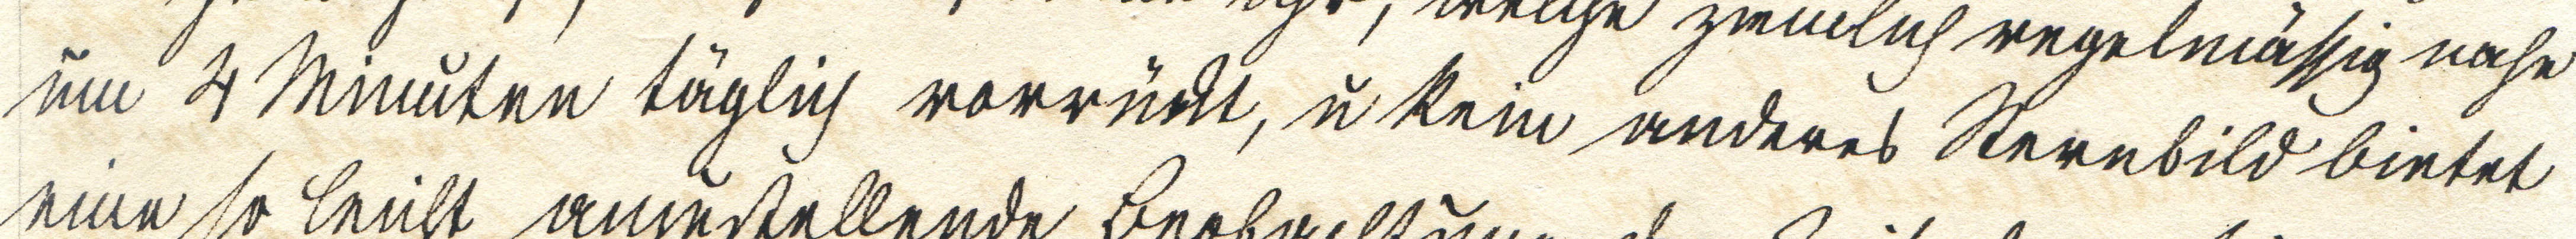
um 4 Minuten täglich vorrückt, u kein anderes Sternbild bietet
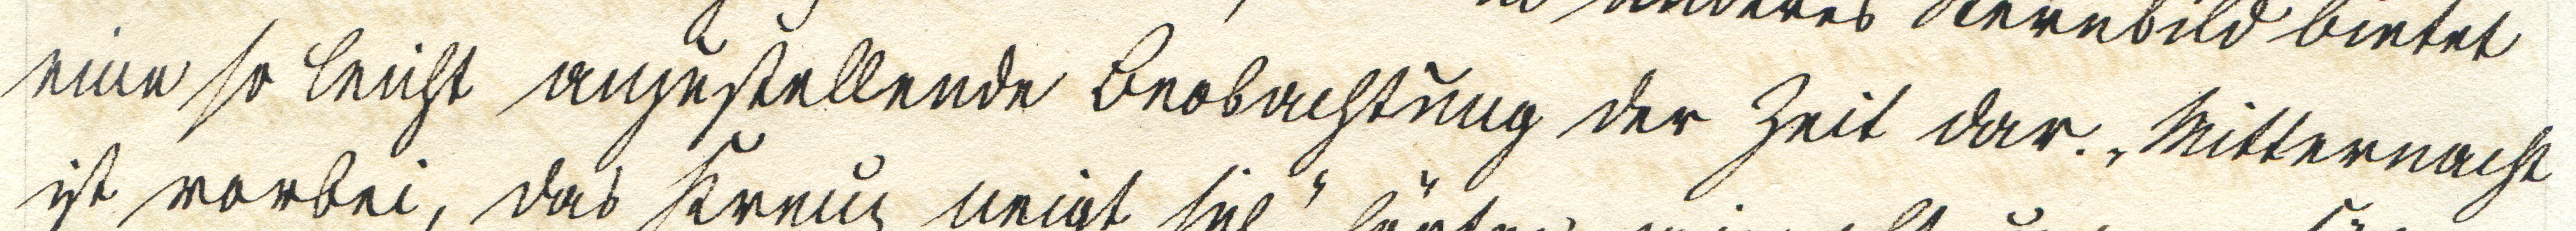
eine so leicht anzustellende Beobachtung der Zeit dar. „Mitternacht
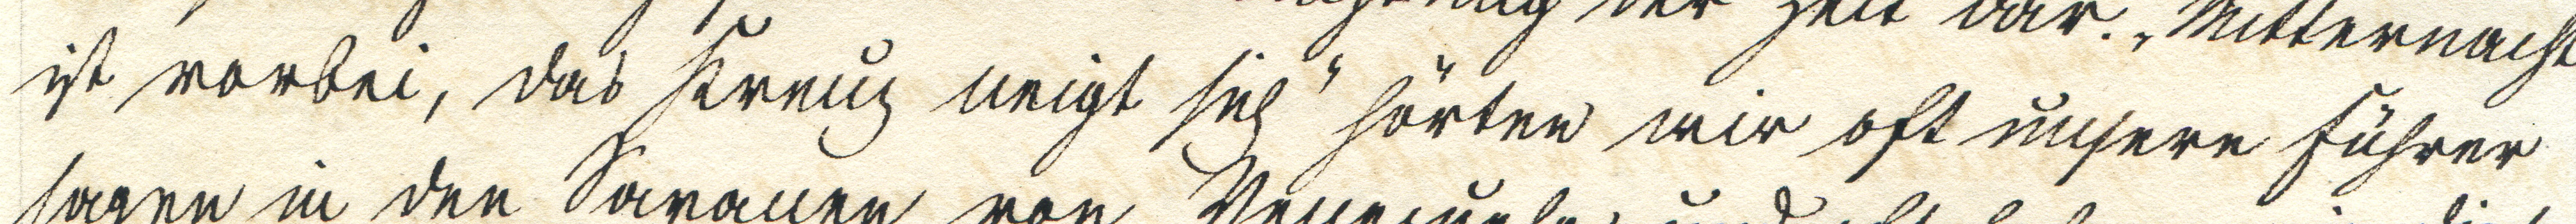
ist vorbei, das Kreuz neigt sich‟ hörten wir oft unsere Führer
